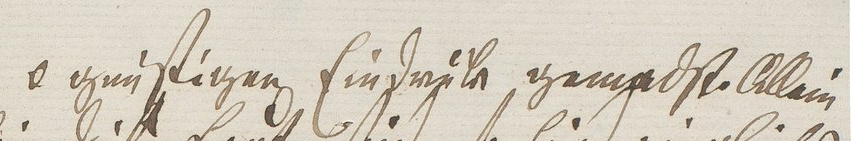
& günstigen Eindruk gemacht. Allein
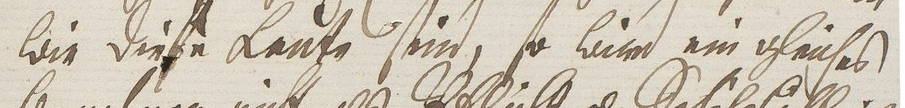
wie diese Leute sind, so wird ein gleiches
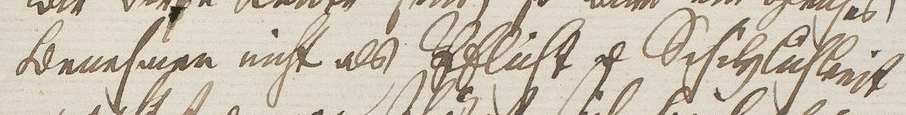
Benehmen nicht als Pflicht & Schiklichkeit
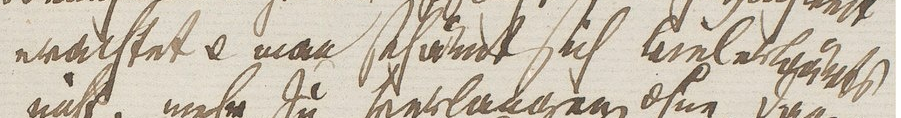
erachtet & man schämt sich vielerwärts
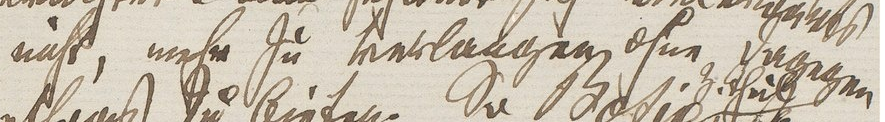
nicht, mehr zu verlangen ohne dagegen
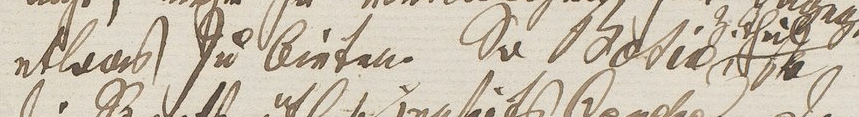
etwas zu bieten. So Bosioz. Theil,
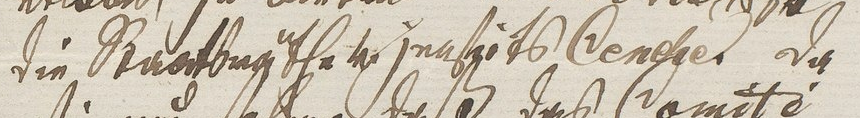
die Staatsräthe v. jenseits Cenere. Da
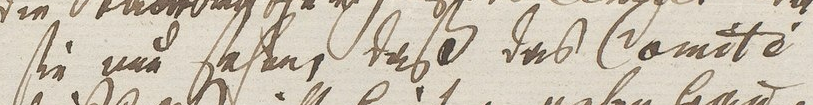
sie nun sehen, daß das Comité
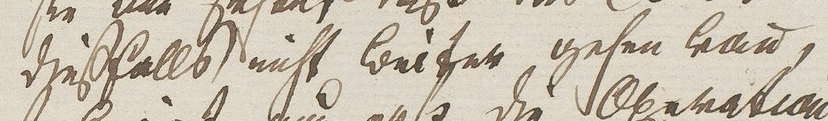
dießfalls nicht weiter gehen kann,
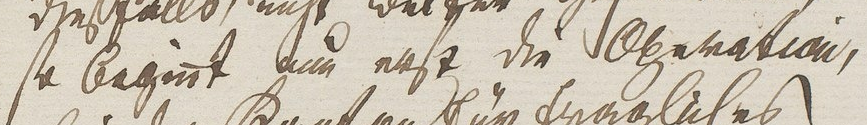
so beginnt nun erst die Operation,
